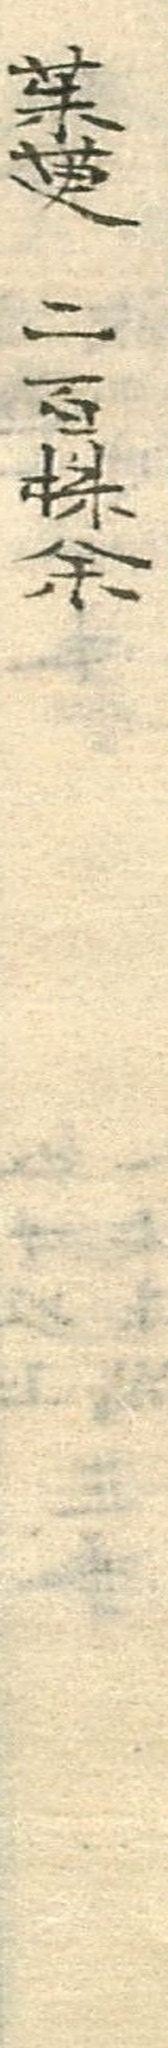茱萸二百株余
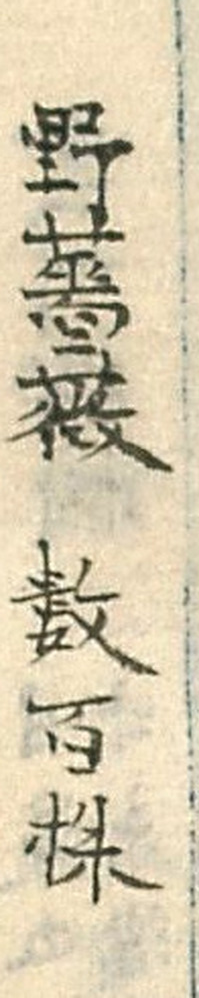野薔薇数百株
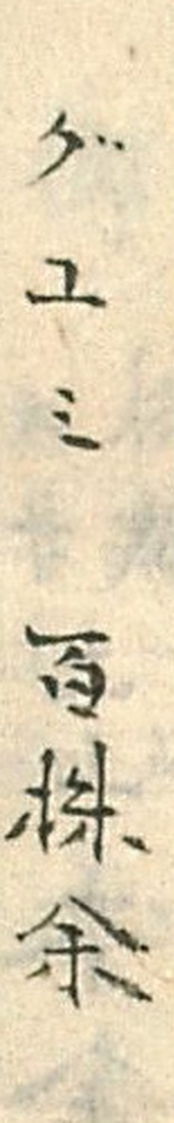グユミ百株余
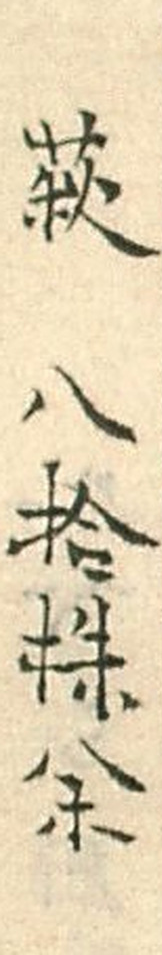萩八十株余
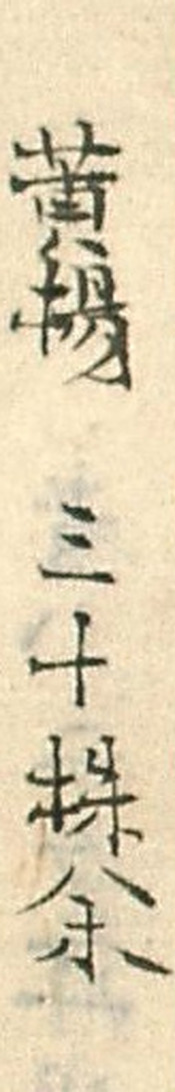黄楊三十株余
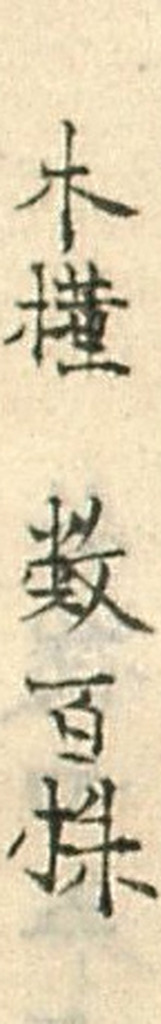木槿数百株
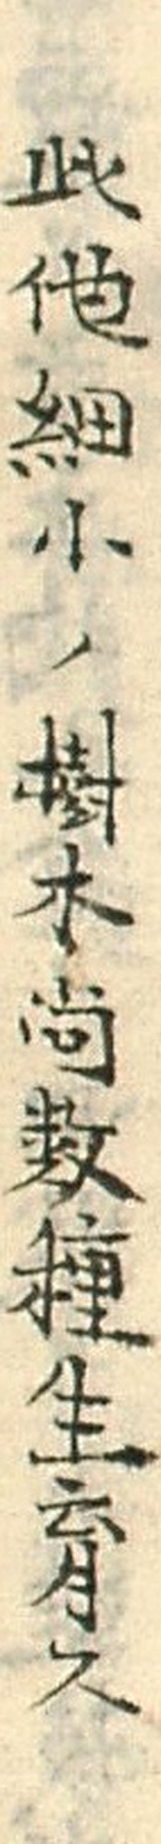此他細小ノ樹木尚数種生育ス
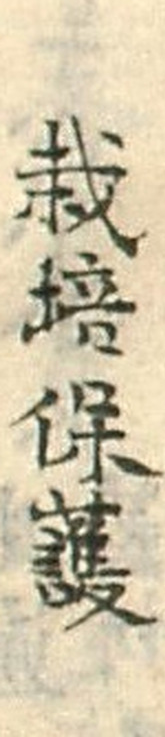栽培保護
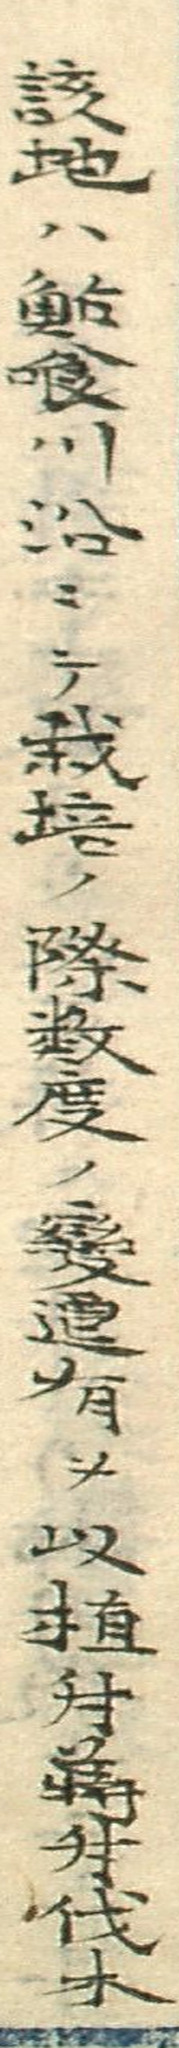該地ハ鮎喰川沿ニテ栽培ノ際数度ノ変遷有ヲ以植付蒔付伐木
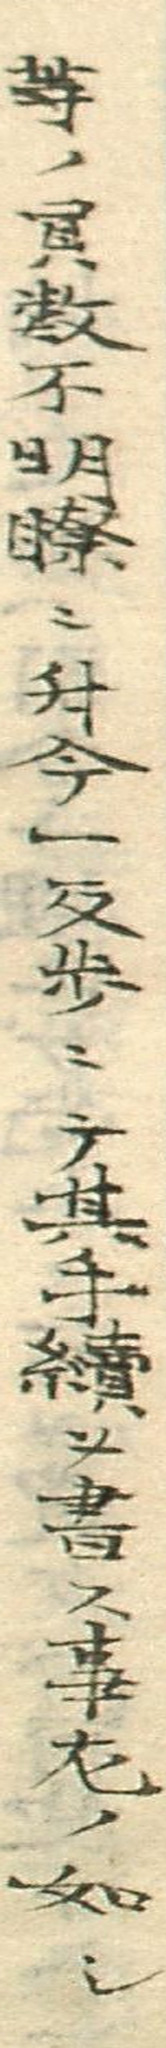等ノ員数不明瞭ニ付今一反歩ニテ其手続ヲ書ス事左ノ如シ
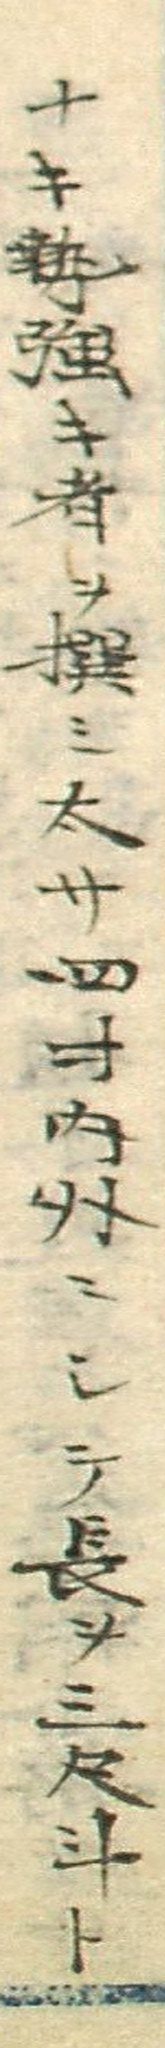ナキ勢強キ者ヲ撰ミ太サ四寸内外ニシテ長ヲ三尺斗ト

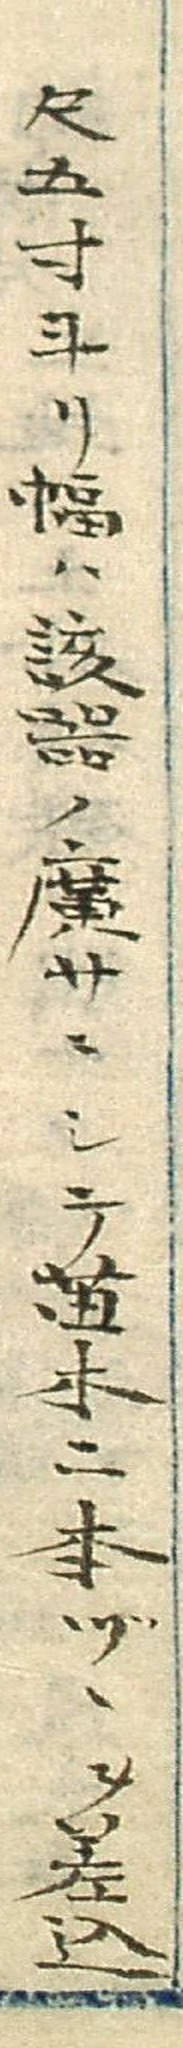尺五寸斗リ幅ハ該器ノ広サニシテ苗木二本ヅヽヲ差込
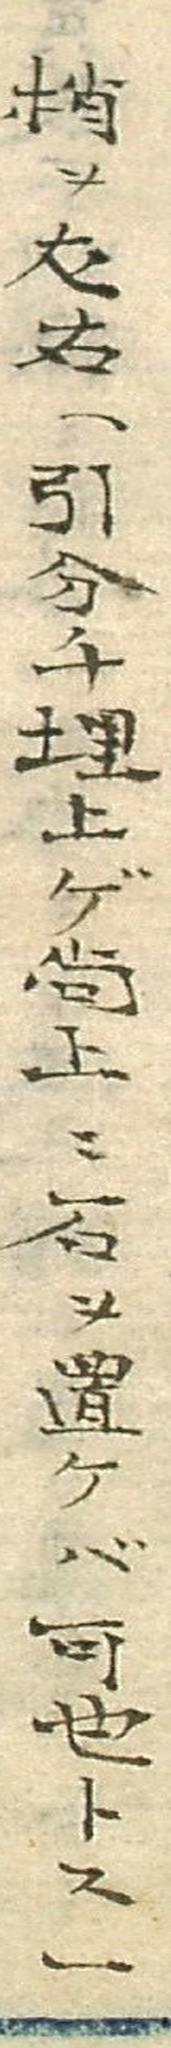梢ヲ左右ヘ引分チ埋上ゲ尚上ニ石ヲ置ケバ可也トス一
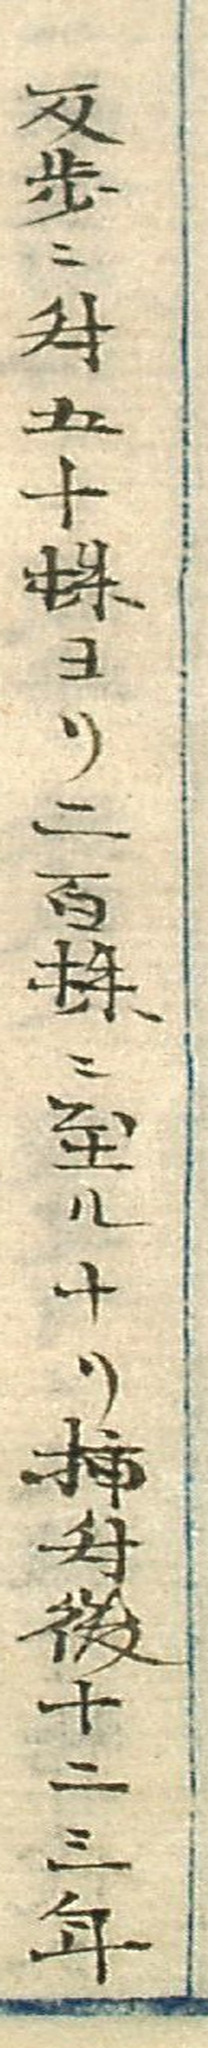反歩ニ付五十株ヨリ二百株ニ至ルナリ挿付後十二三年
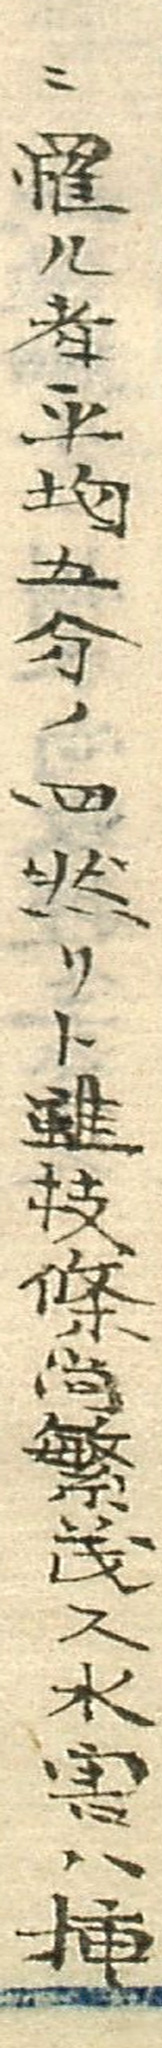ニ罹ル者平均五分ノ四然リト雖枝条尚繁茂ス水害ハ挿
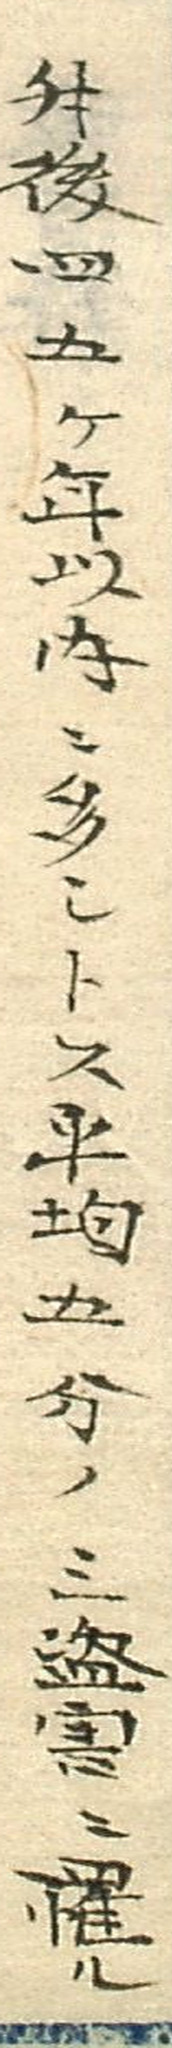付後四五ヶ年以内ニ多シトス平均五分ノ三盗害ニ罹ル
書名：山林共進会取調書
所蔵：鳴門教育大学 Naruto University of Education
